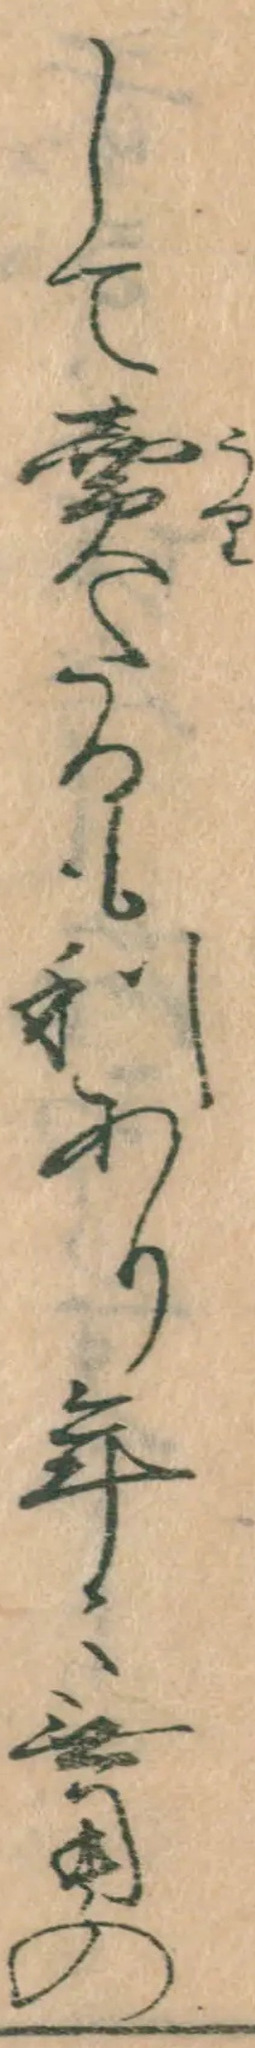して売たるも利あり年々無用の
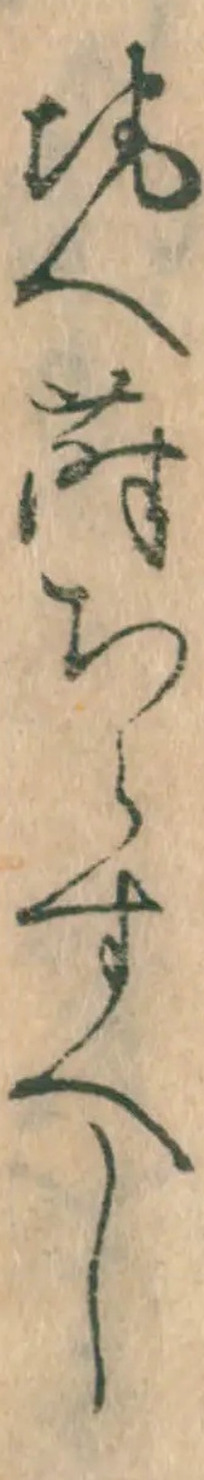地へ蒔ちらすへし

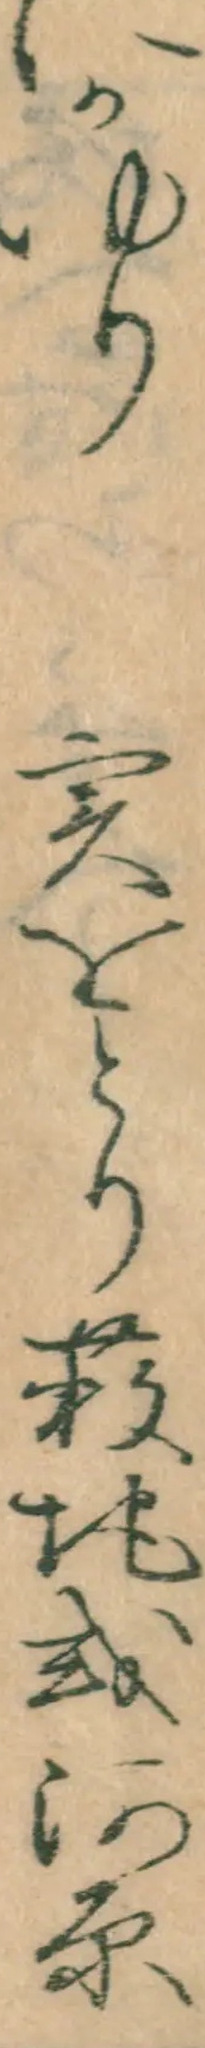にかゆり実をとり藪地或河原
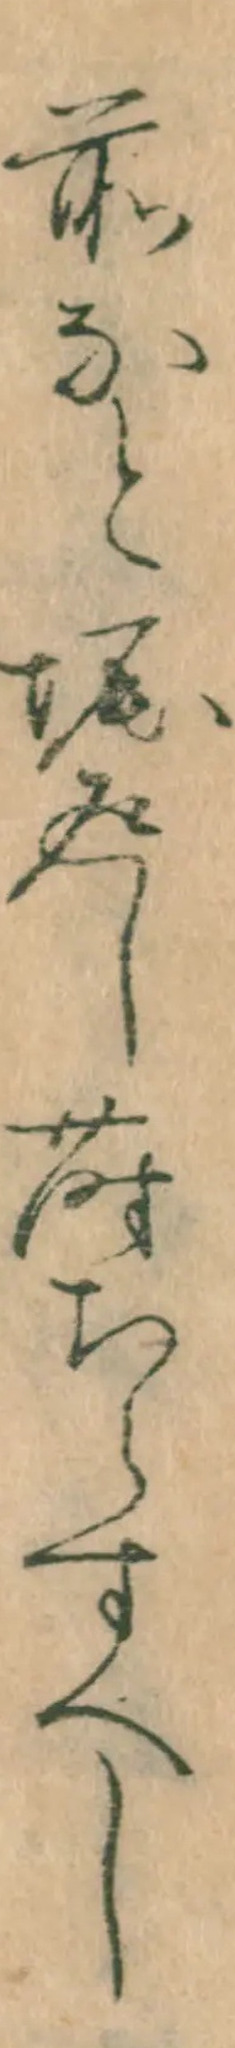前なと堀返し蒔ちらすへし
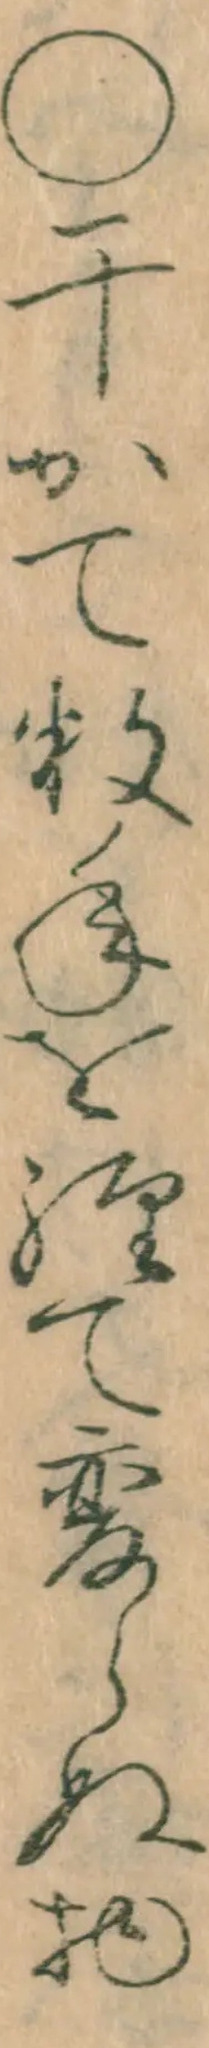○干かて数年を経て変らぬ物
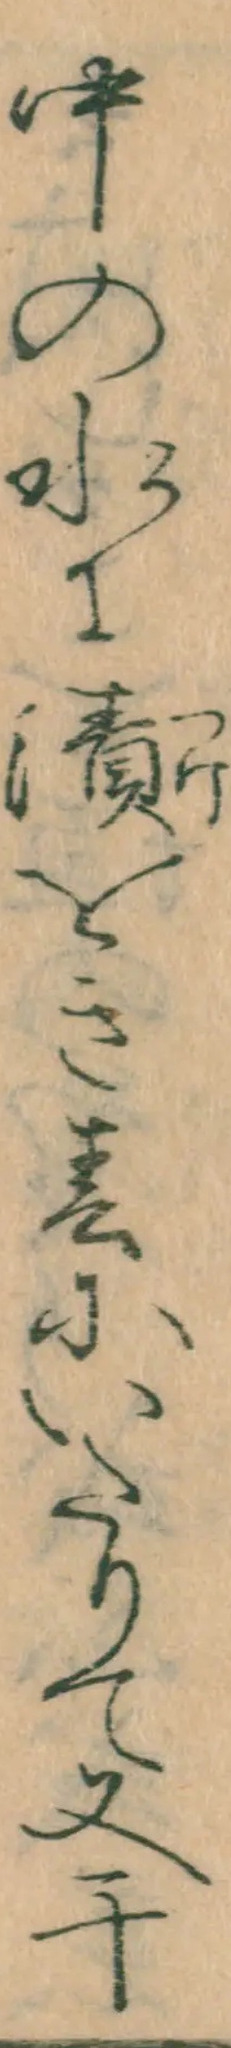中の水に漬をき春にいたりて又干
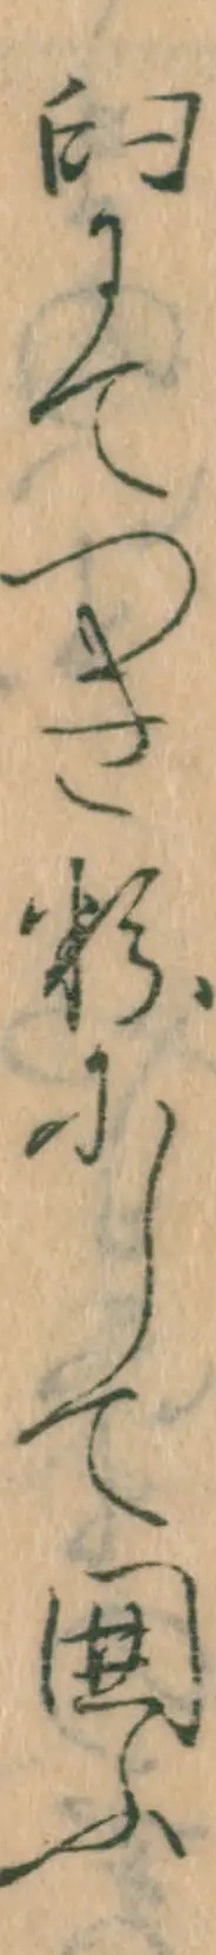臼にてつき粉にして囲ふ
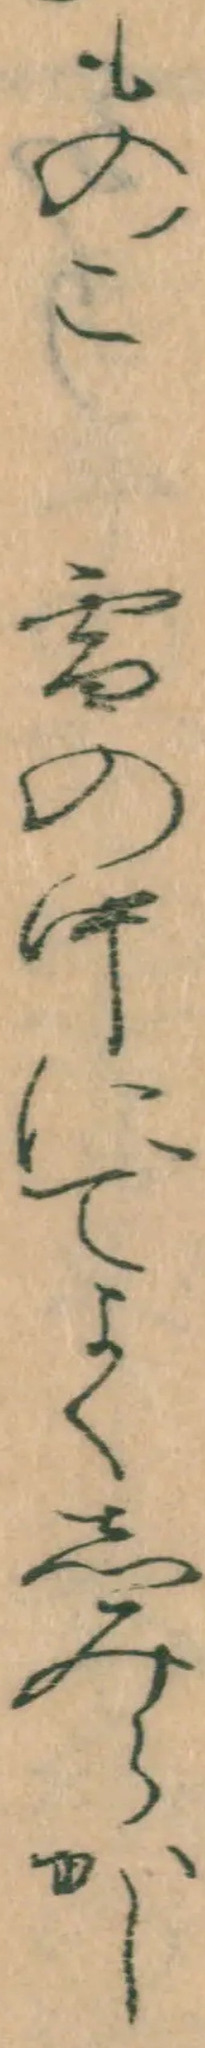いものこ雪の中にてよくしみらかし
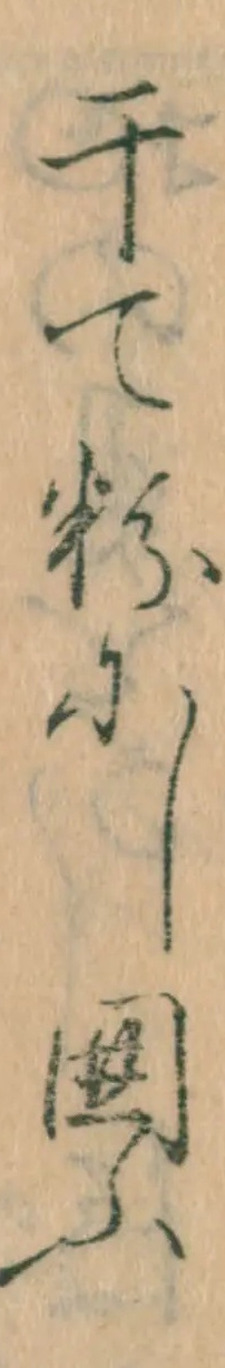干て粉にし囲ふ
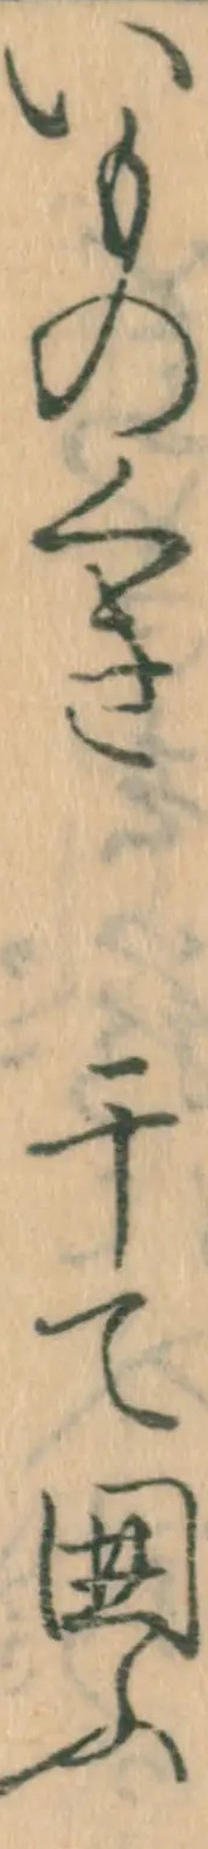いものくき干して囲ふ
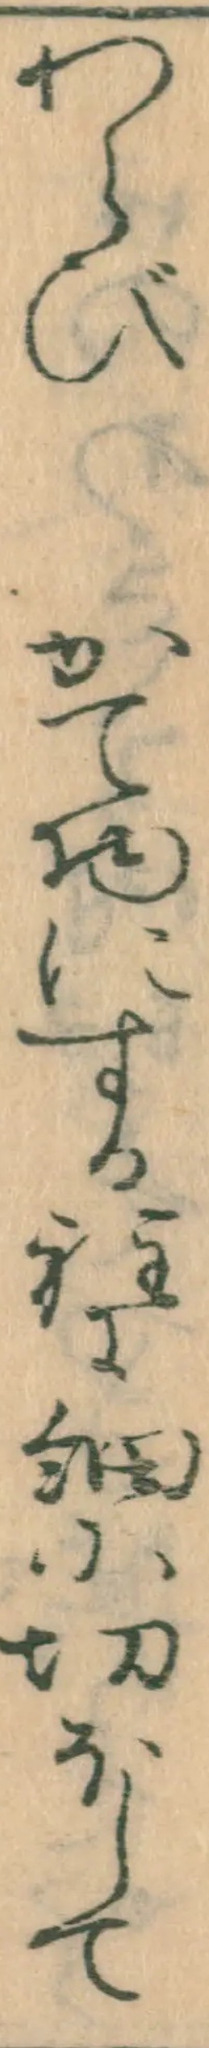わらびかて物にする程に細に切ほして
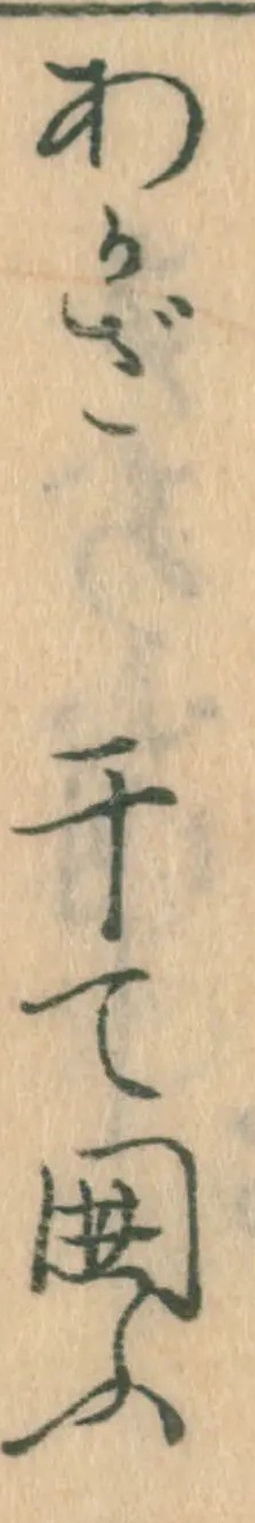あかざ干て囲ふ
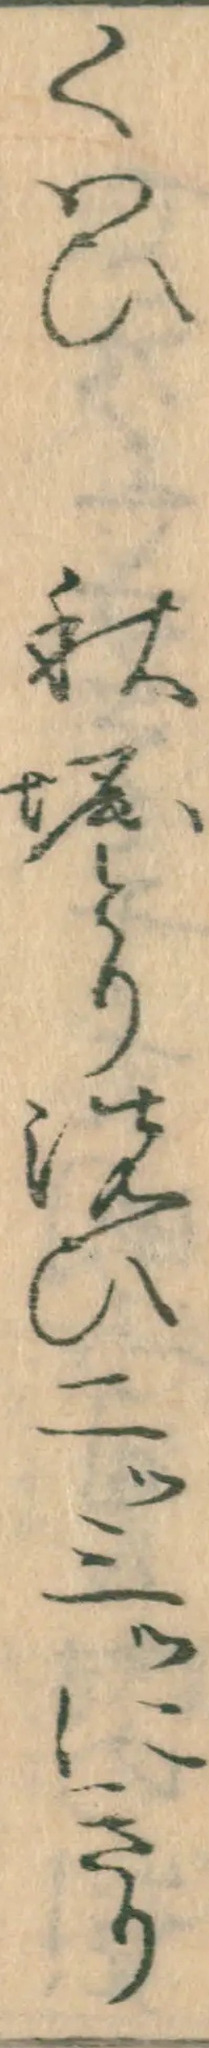くわひ秋堀とり洗ひ二ツ三ツにきり
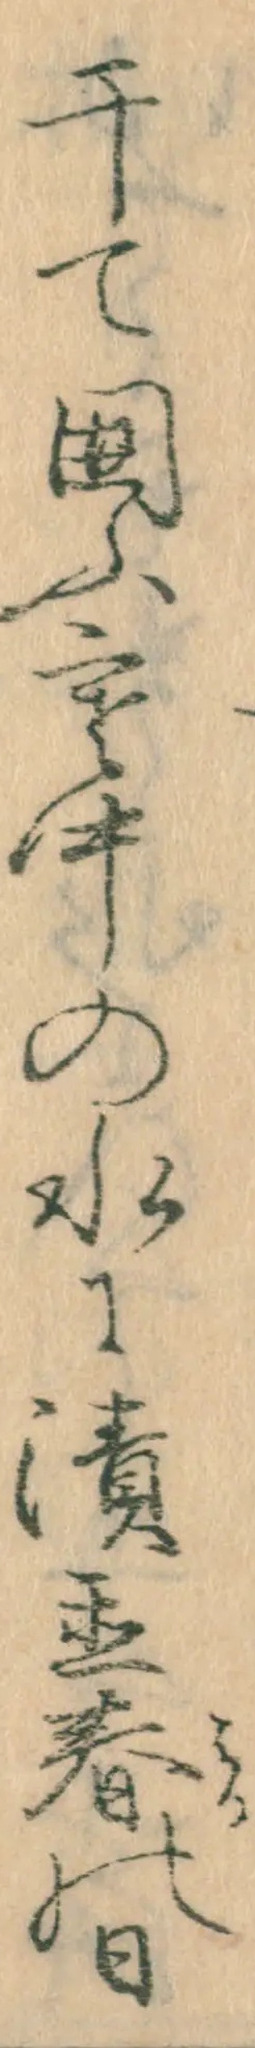干て囲ふ寒中の水に漬置春の日
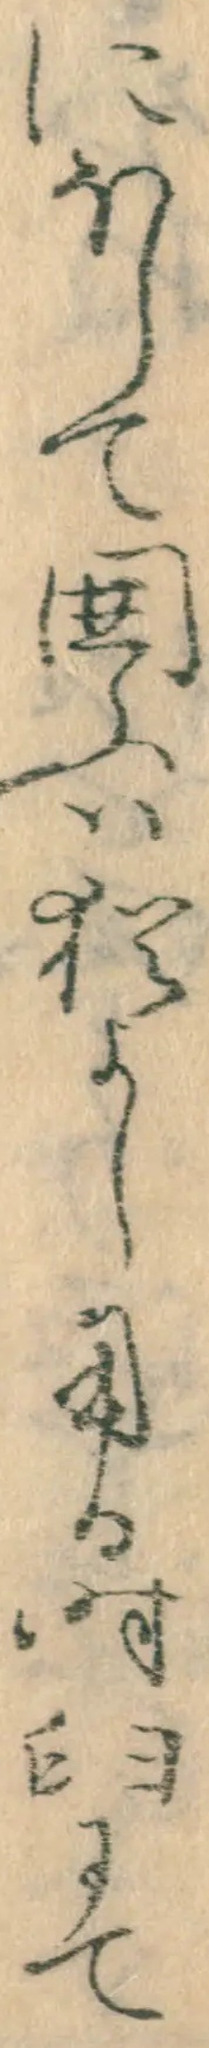にほして囲ふは猶よし用る時臼にて
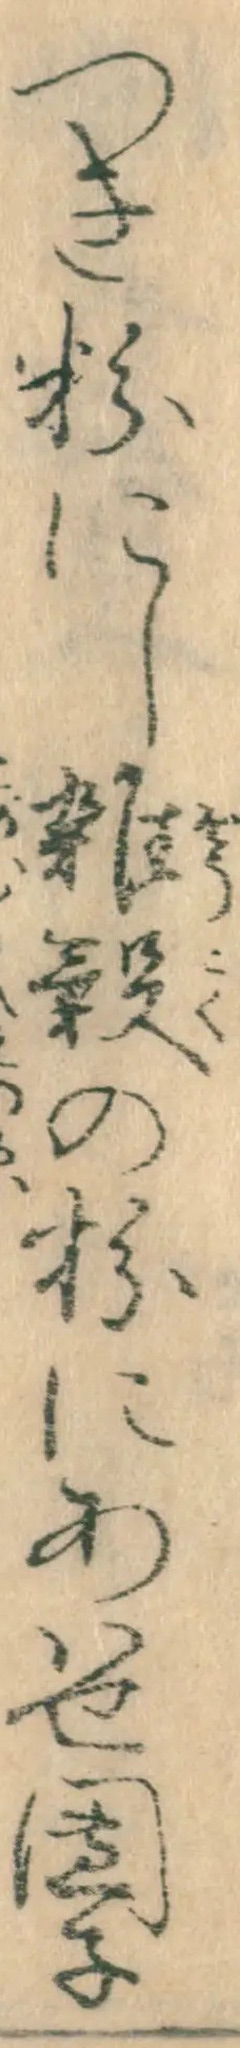つき粉にし雑穀の粉にあはせ団子
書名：かてもの
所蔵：国立国会図書館 National Diet Library, JAPAN
